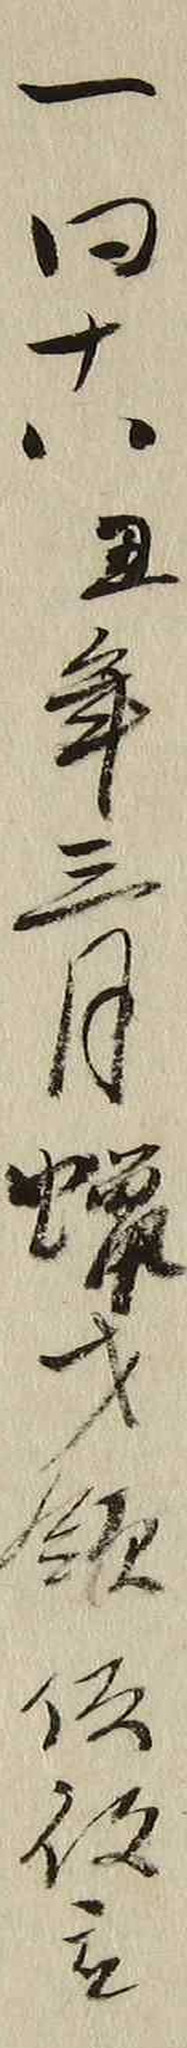一同十八丑年三月蠟才領仮役被
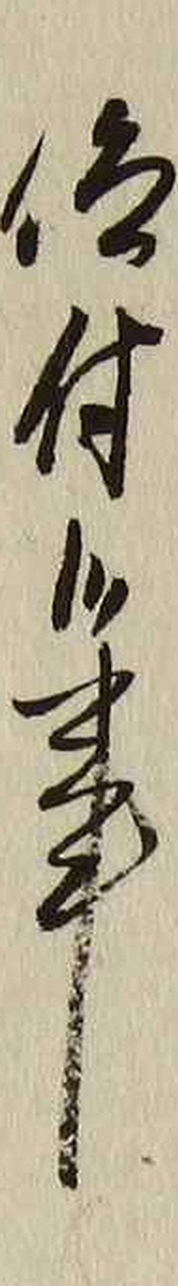仰付候事
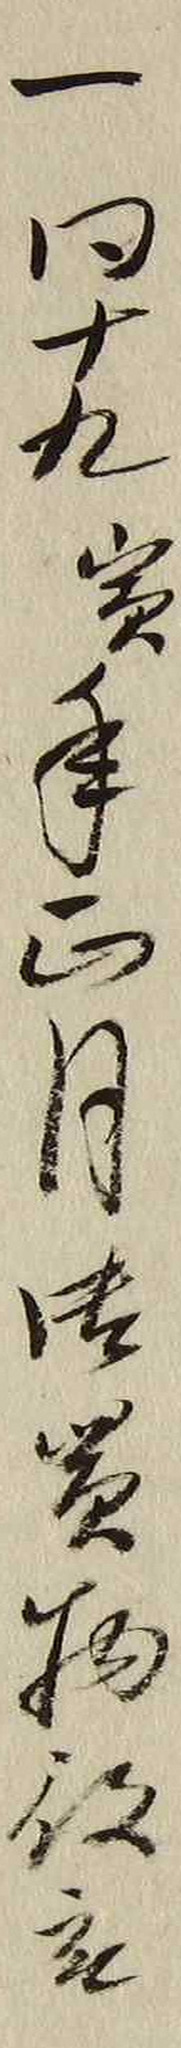一同十九寅年正月御買物役被
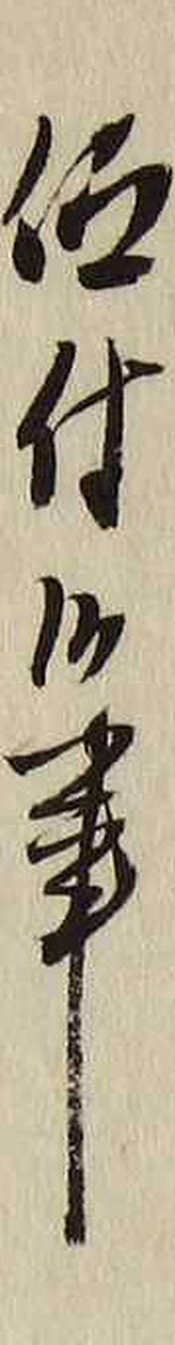仰付候事
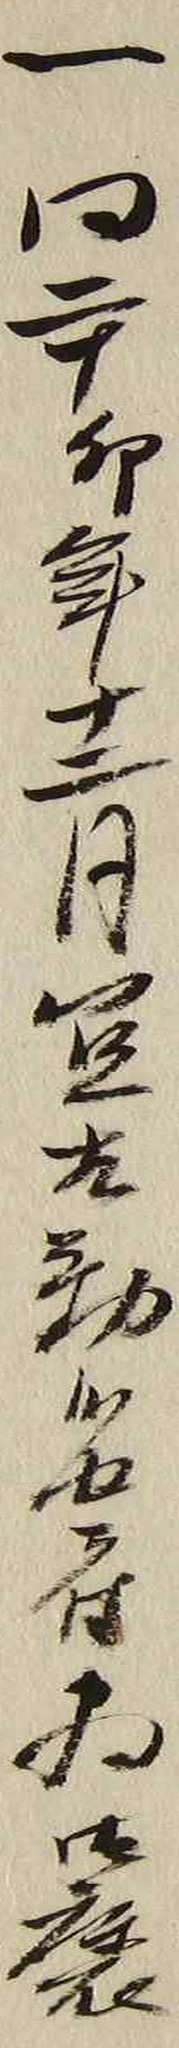一同二十卯年十二月宜相勤候由付為御褒
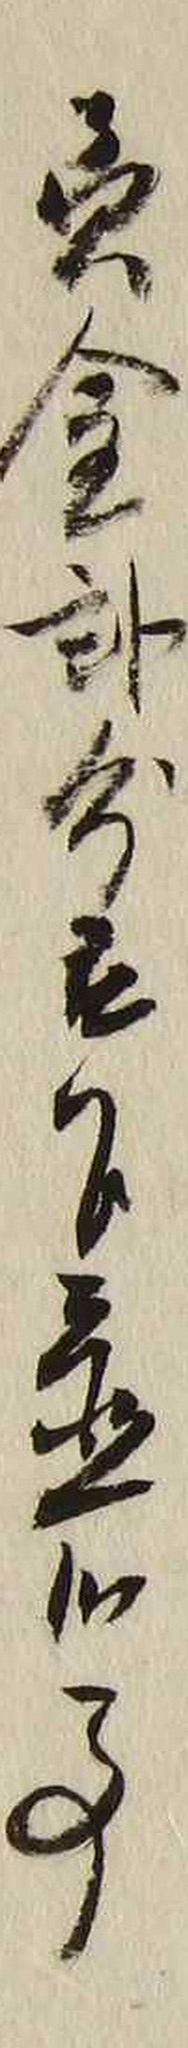美金弐分被下置候事
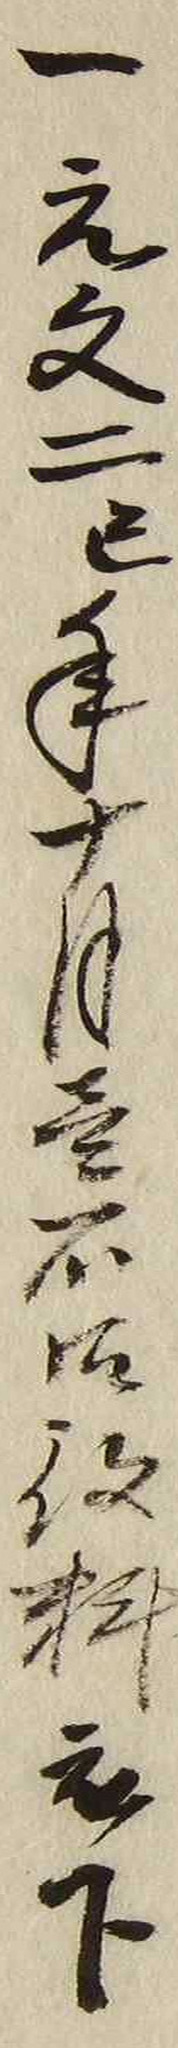一元文二巳年十月壱石御役料被下

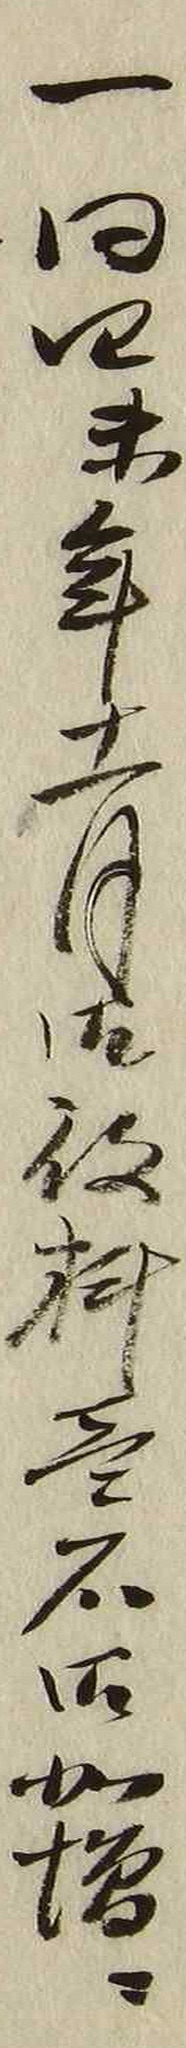一同四未年十一月御役料壱石御増
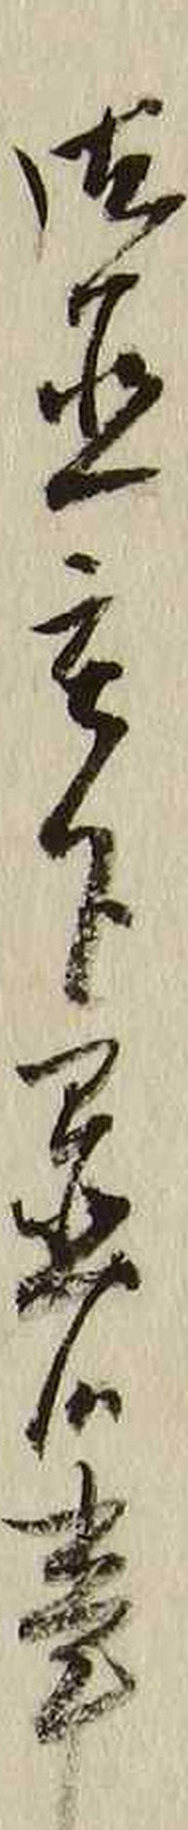御直被下置候事
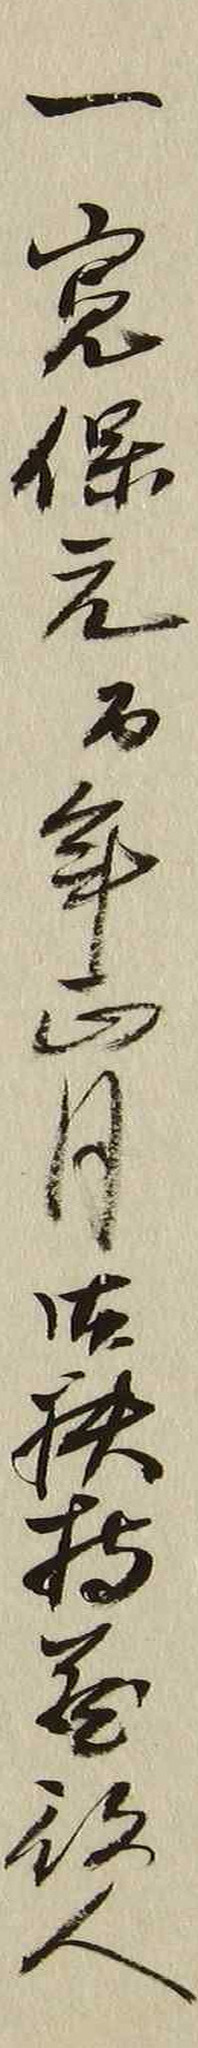一寛保元酉年正月御扶持蔵役人
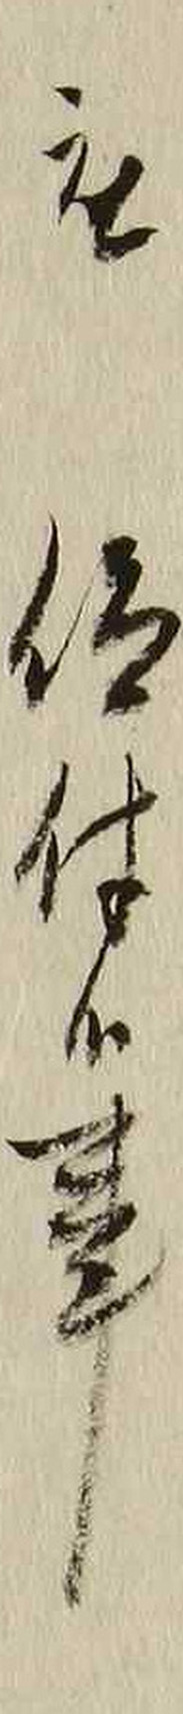被仰付候事
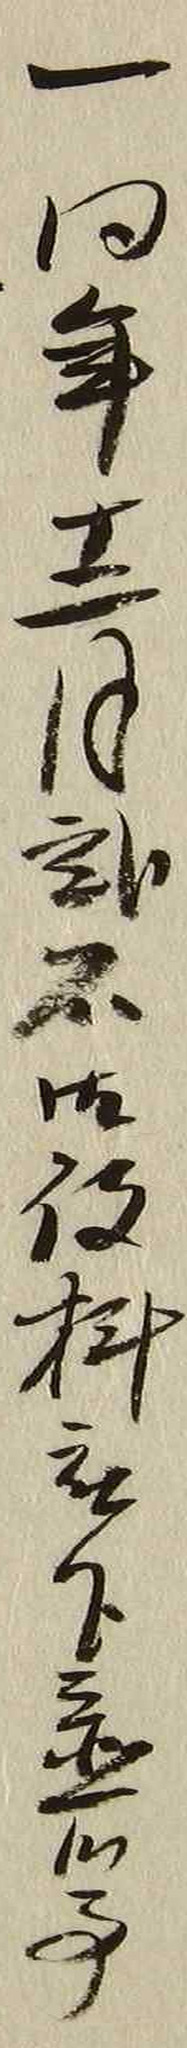一同年十二月弐石御役料被下置候事
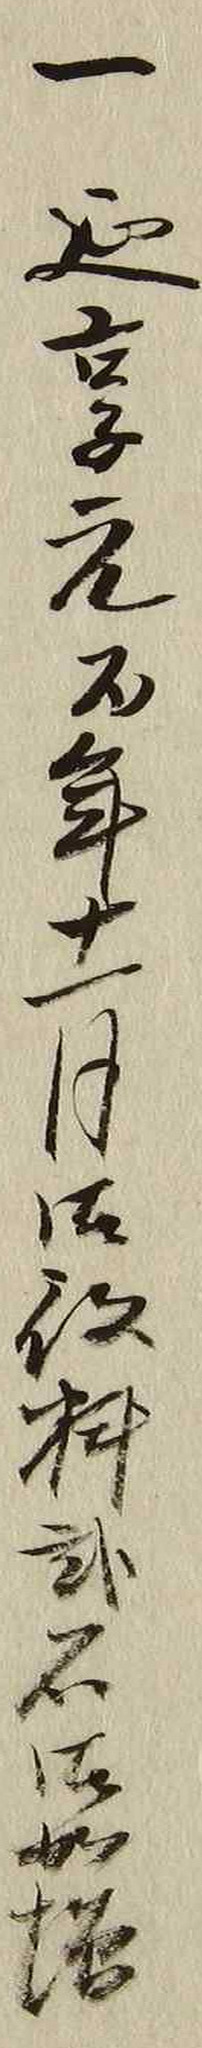一延享元酉年十一月御役料弐石御加増
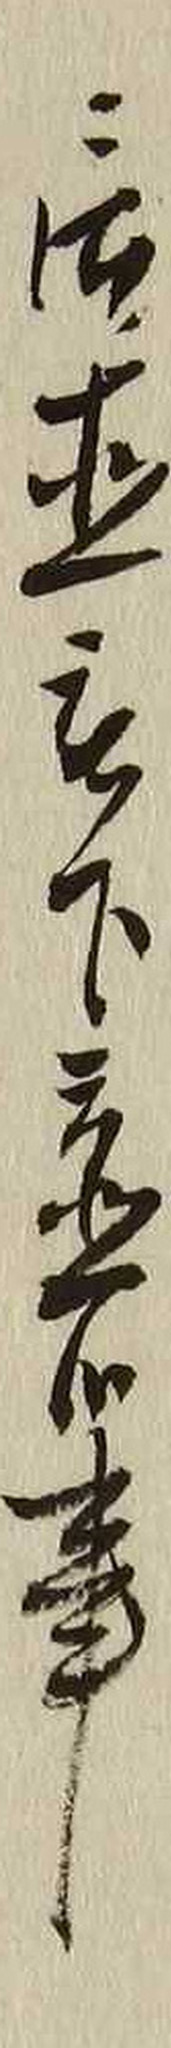御直被下置候事
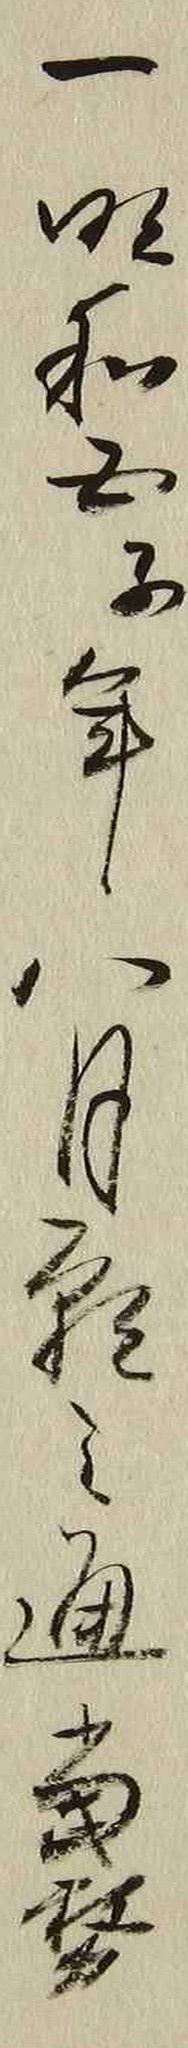一明和五子年八月願之通当務
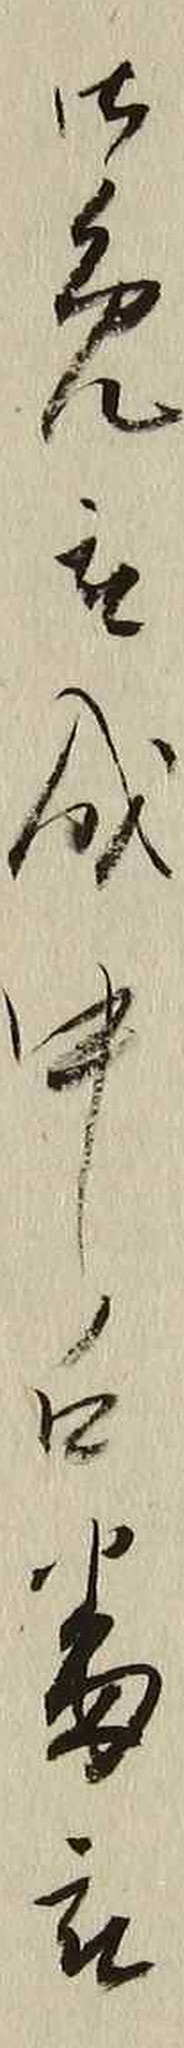御免被成中口番被
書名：諸士系譜　巻之350　せ之部1冊全
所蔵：会津若松市立会津図書館
